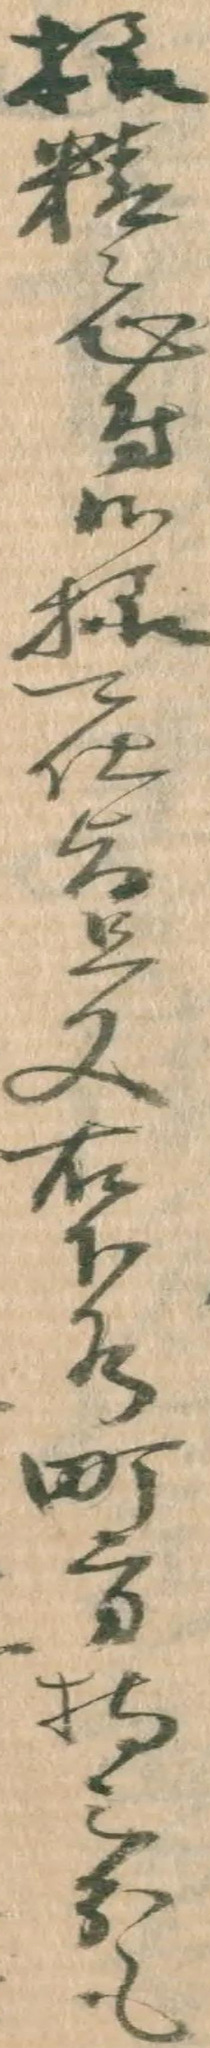│様精〻心付候様可仕旨且又右下水町方持之分も
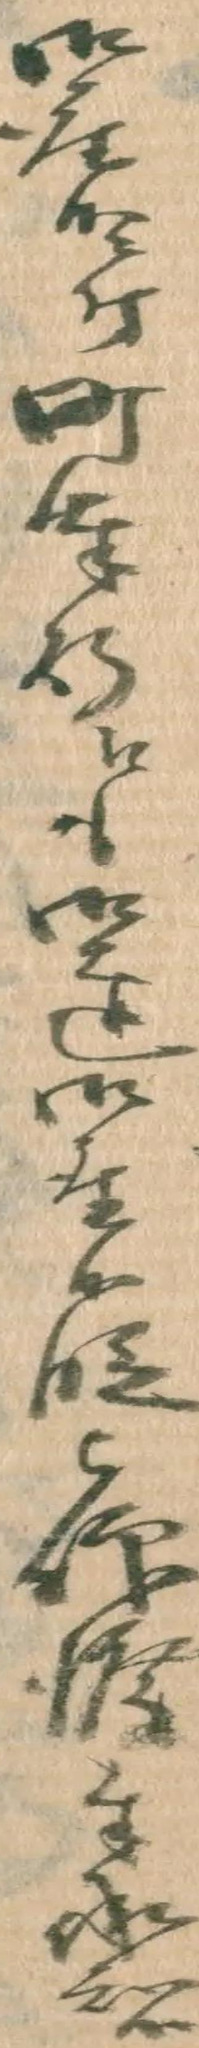│御座候ニ付町奉行えも御達御座候段被仰渡奉承知候
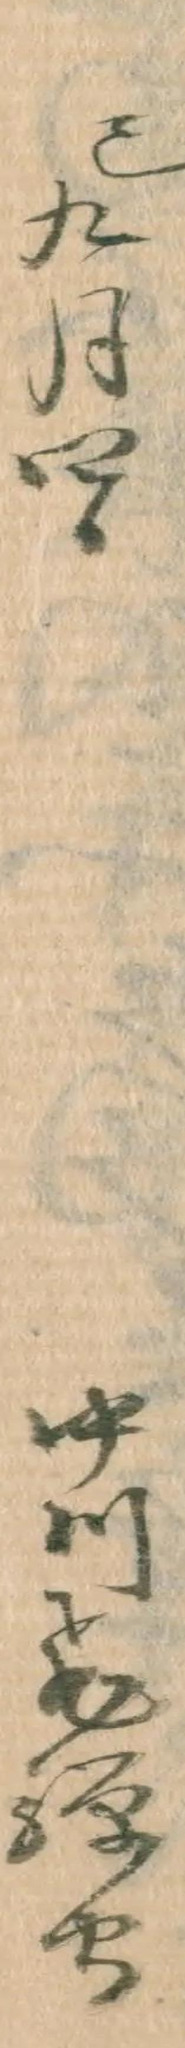└巳九月四日中川飛騨守
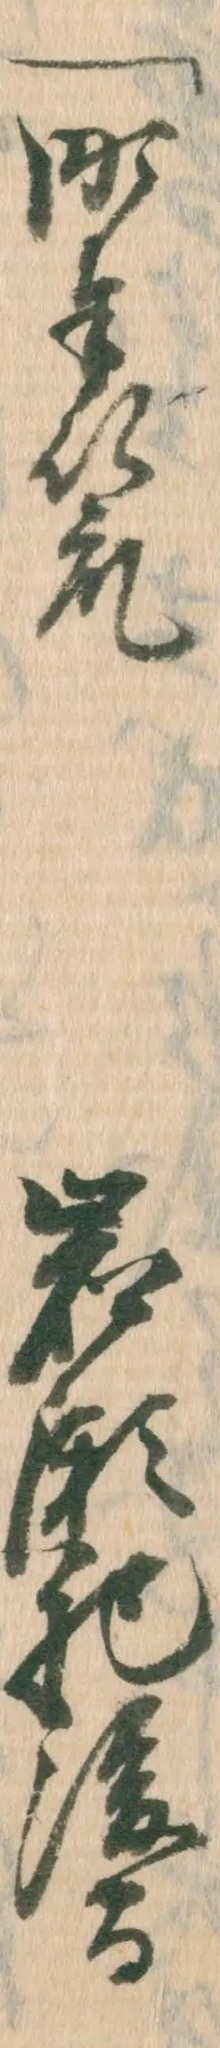│[町奉行衆岩瀬肥後守
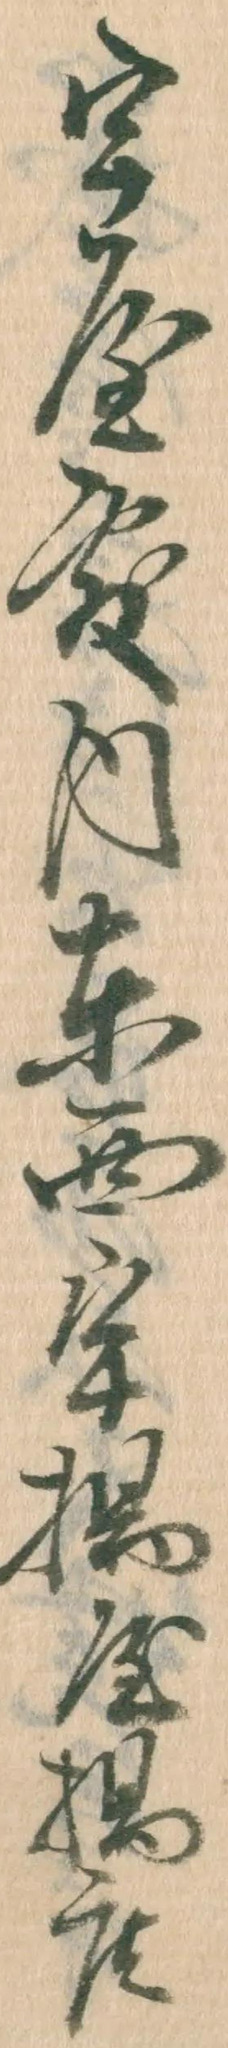牢屋敷内東西牢揚屋揚座
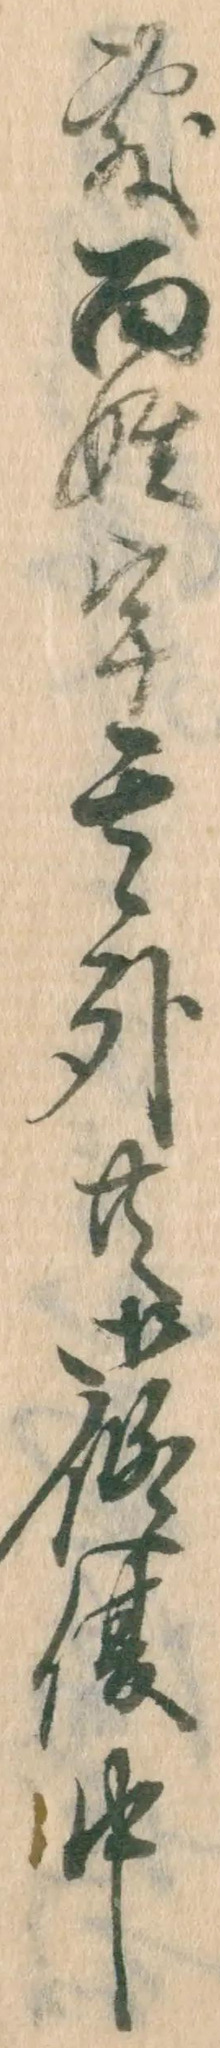敷百姓牢其外共御修復中

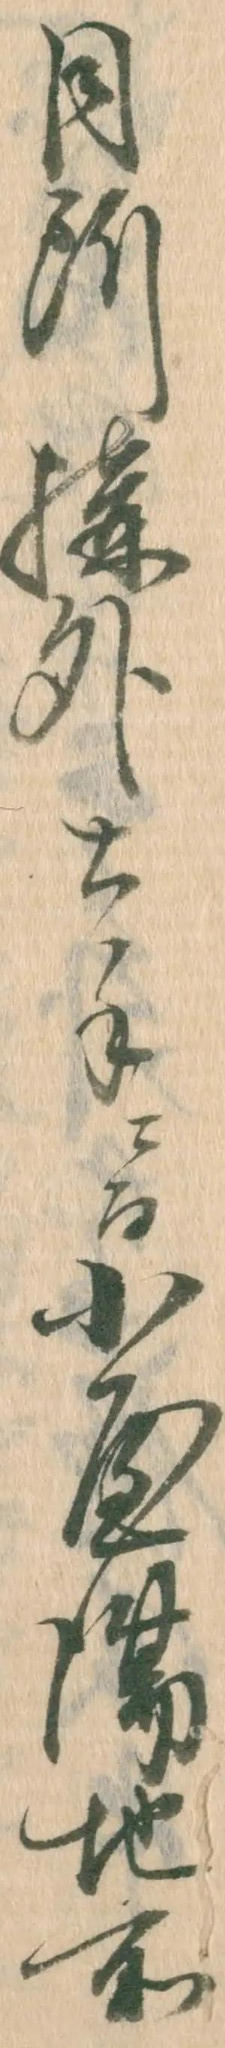同所構外土手ニて小屋場地所
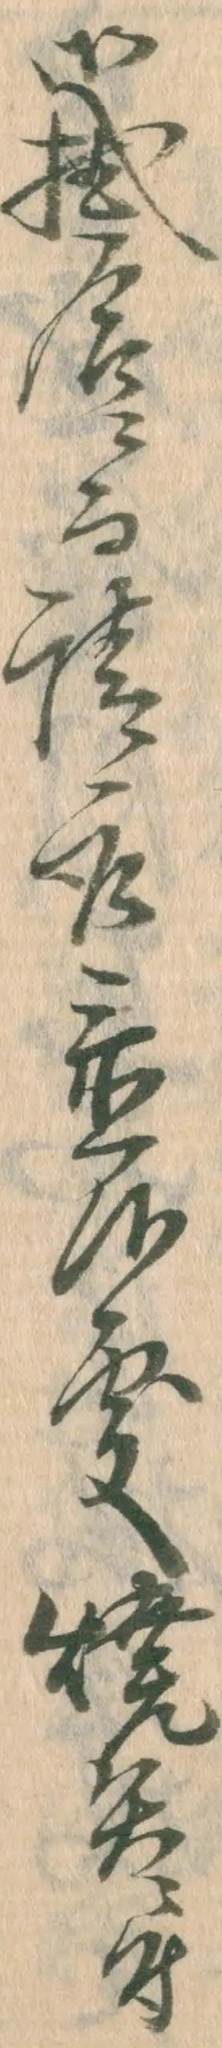御掛屋ニて請取置候処焼失ニ付
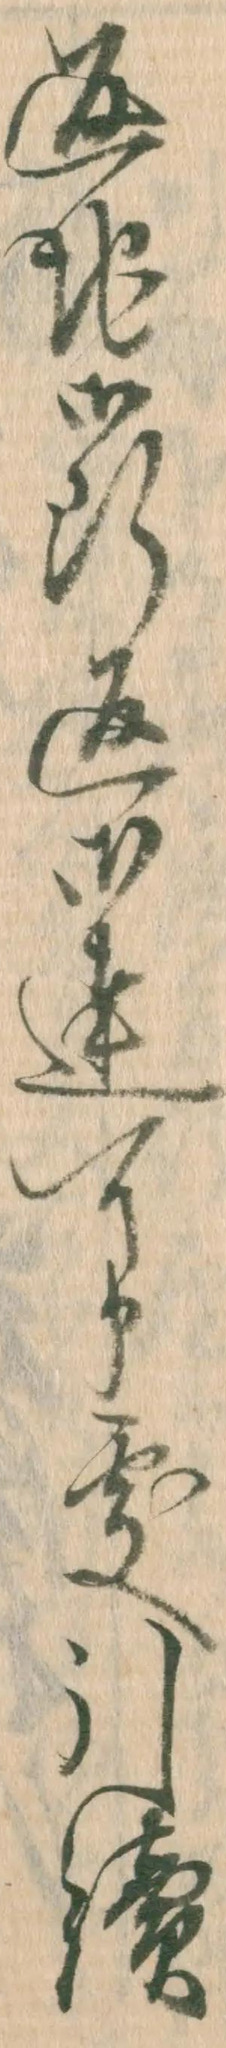返地御断返御達可申処引続
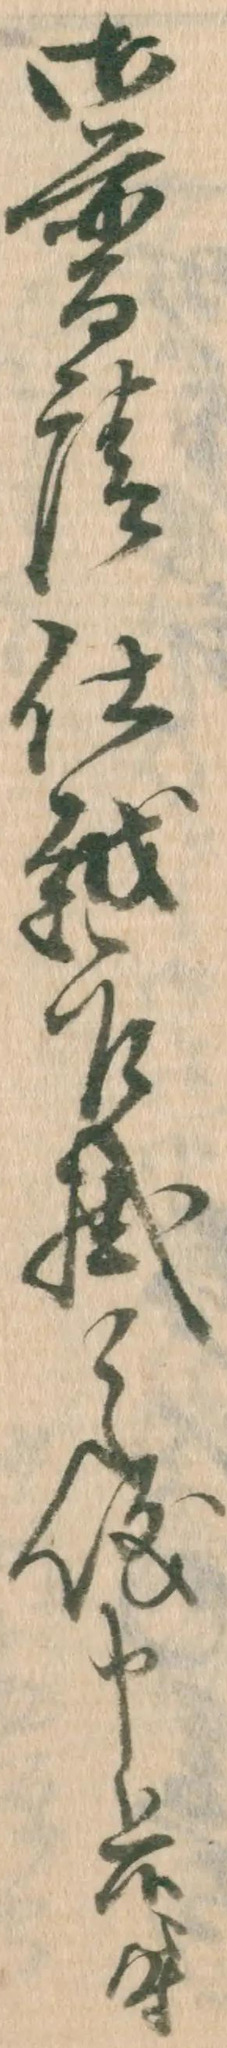御普請仕越差掛之儀申上候ニ付
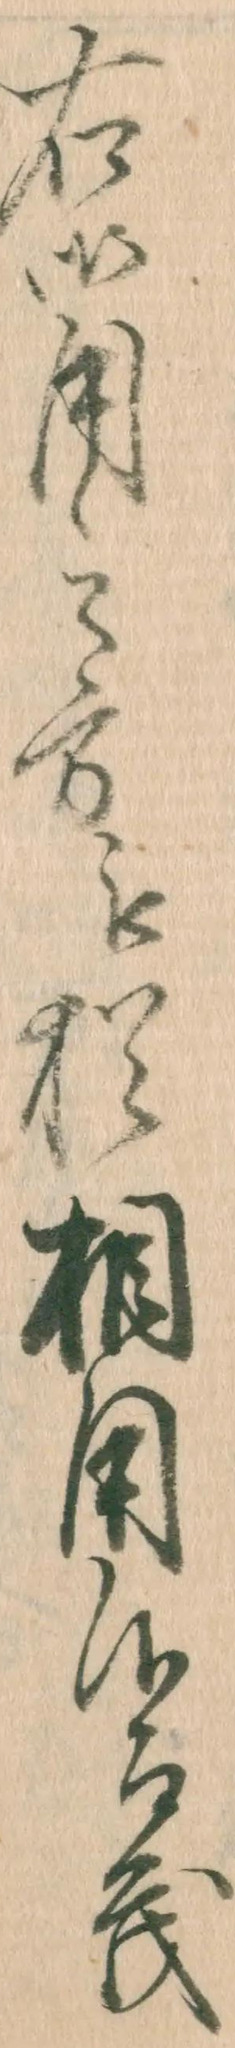右御用之方え猶相用候ても
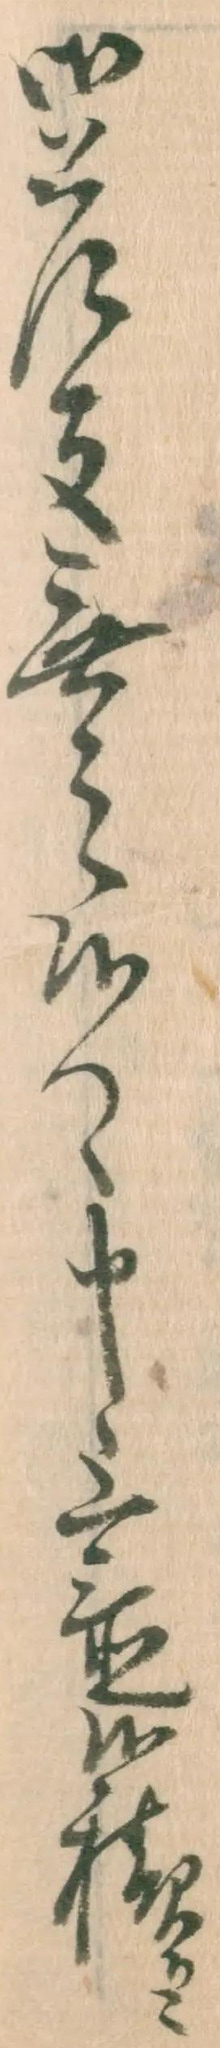御差支無之候ハヽ申上置候様ニ
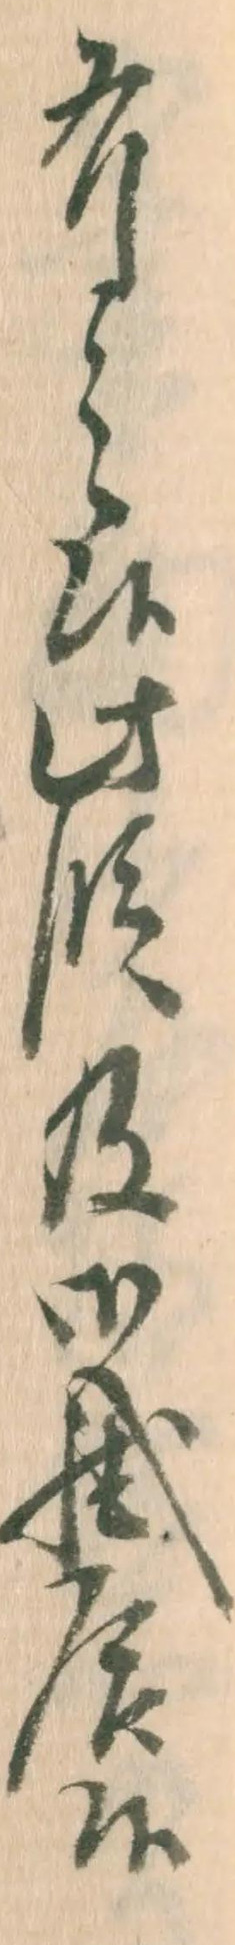有之候此段及御掛合候

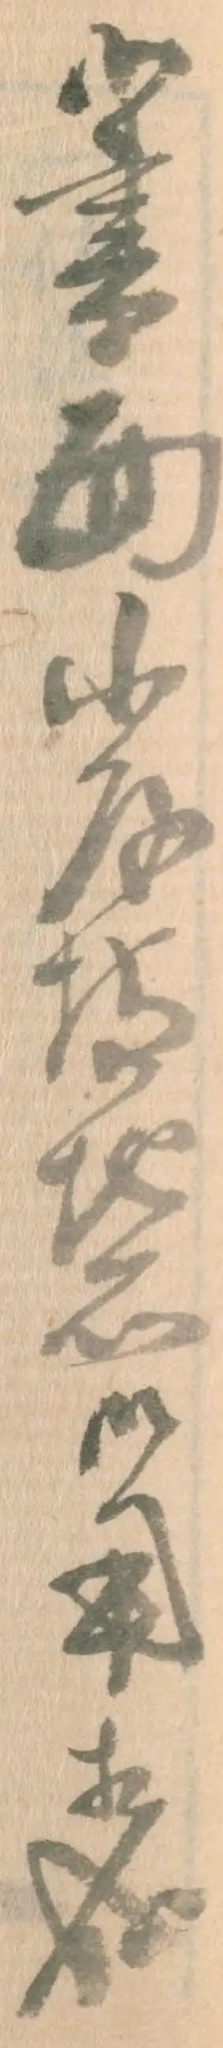御書面小屋持地所御用相成
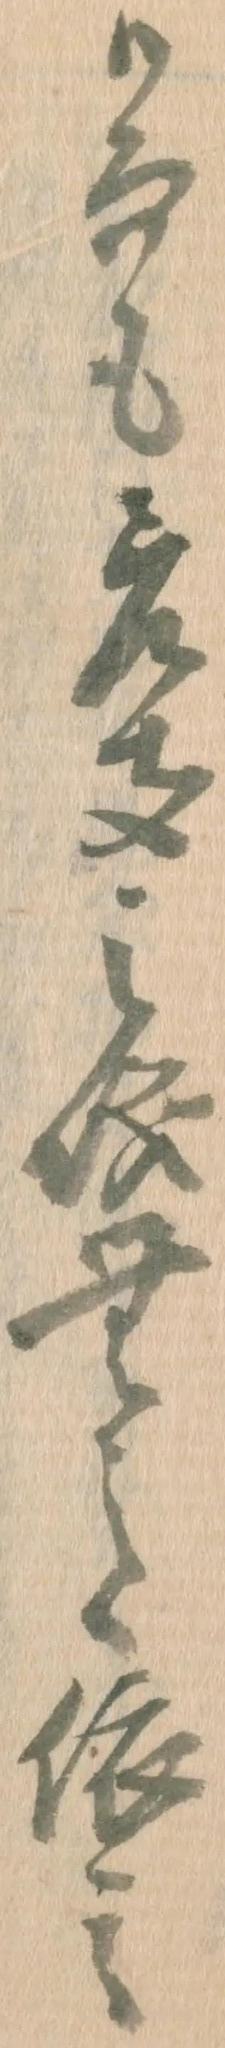候ても差支之儀無之候依之
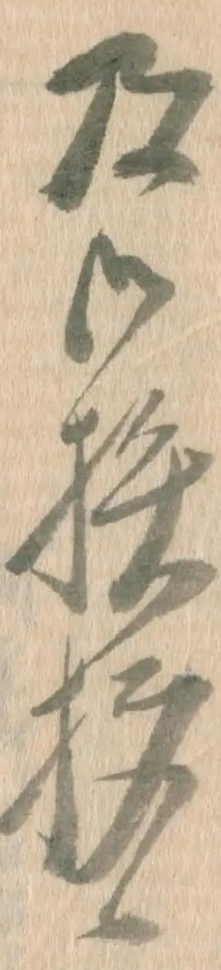及御挨拶候
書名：七十冊物類集 71巻. [44] 四十三 牢屋敷御普請御修覆地震ニ付骨折候牢屋掛御褒美之部
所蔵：国立国会図書館 National Diet Library, JAPAN
